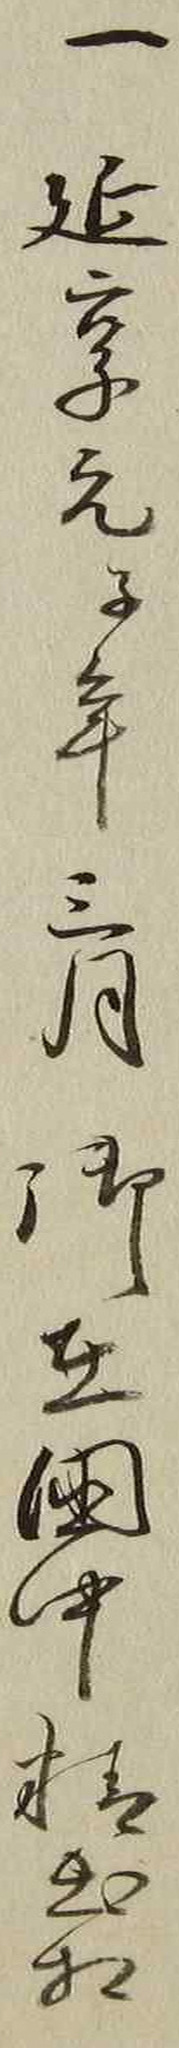一延享元子年三月御在国中精出相
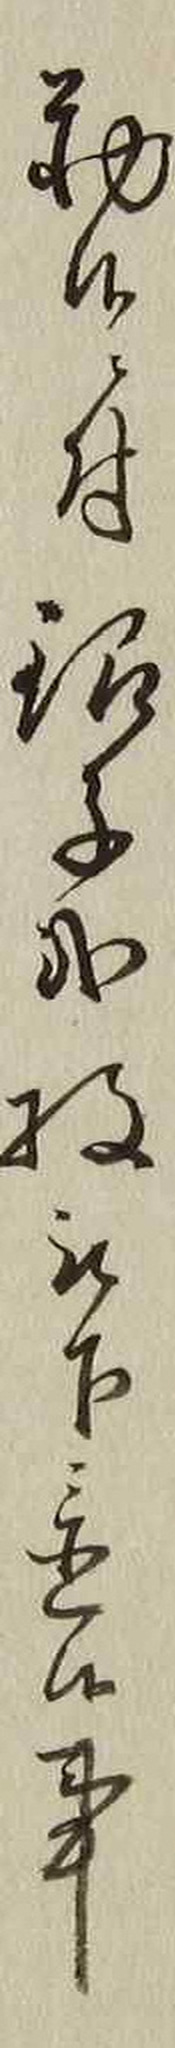勤候ニ付銀子弐枚被下置候事
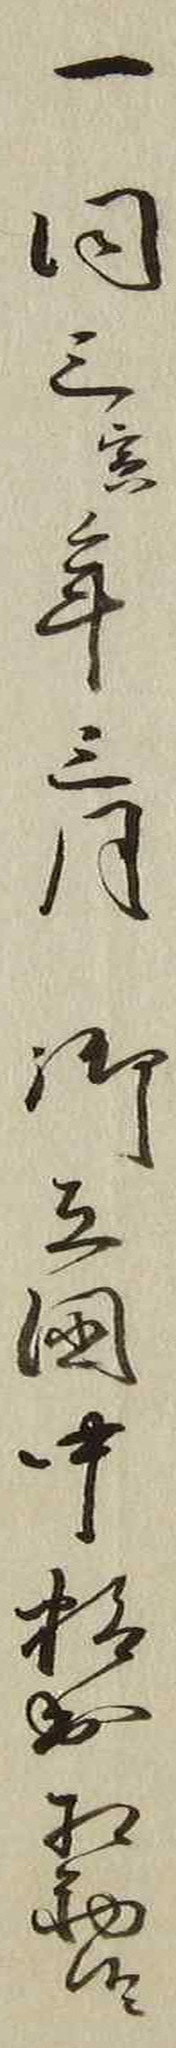一同三寅年三月御在国中精出相勤候ニ
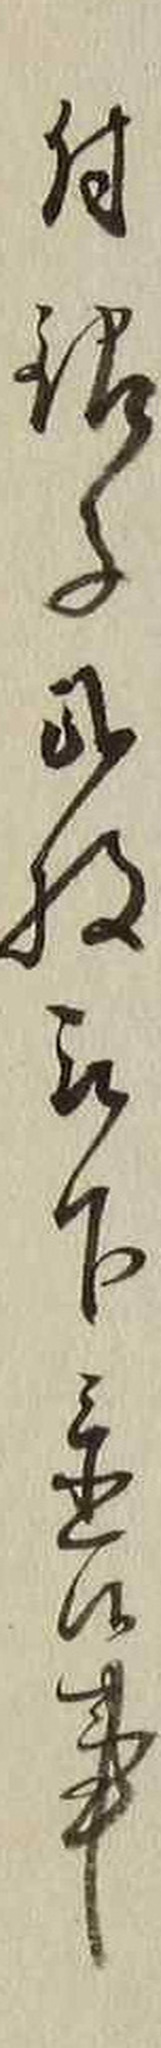付銀子弐枚被下置候事
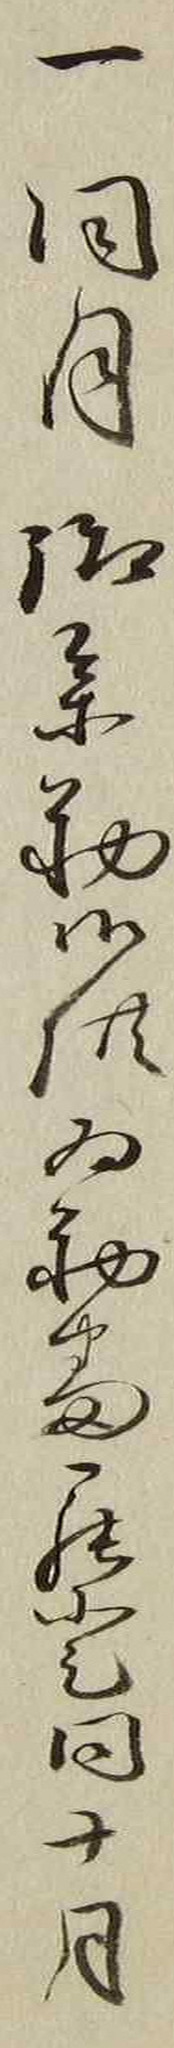一同月御参勤御供為勤番罷登同十月
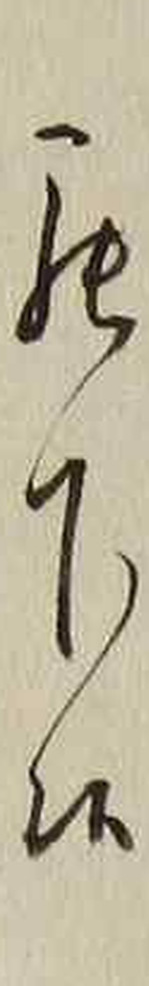罷下候
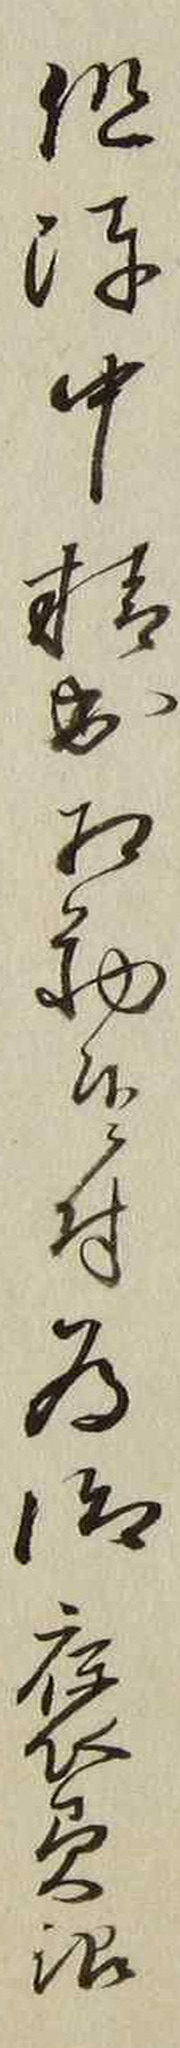但陣中精出相勤候ニ付為御褒美銀
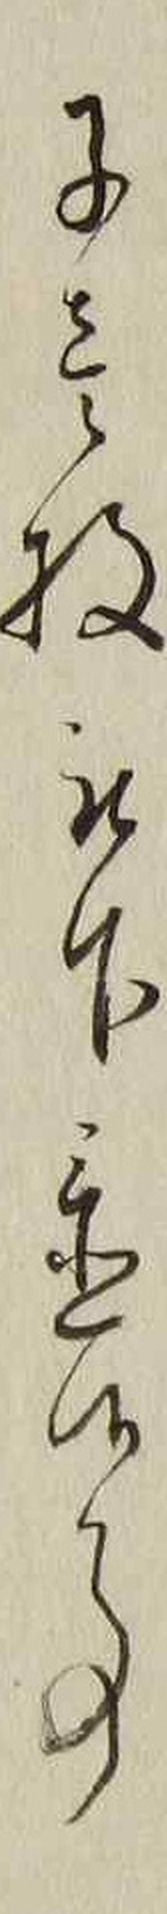子壱枚被下置候事
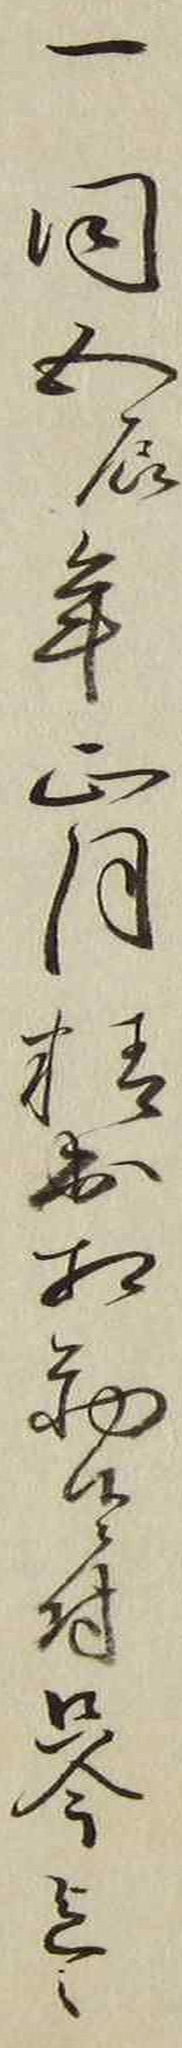一同五辰年正月精出相勤候ニ付只今迄之
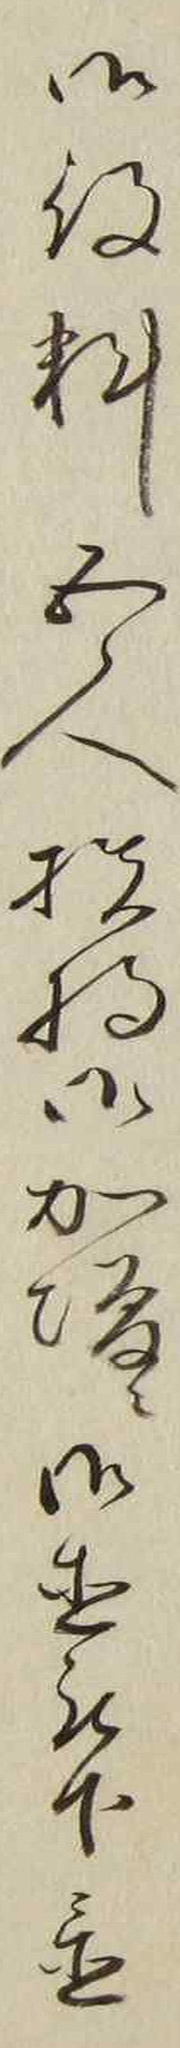御役料五人扶持御加増ニ御直被下置

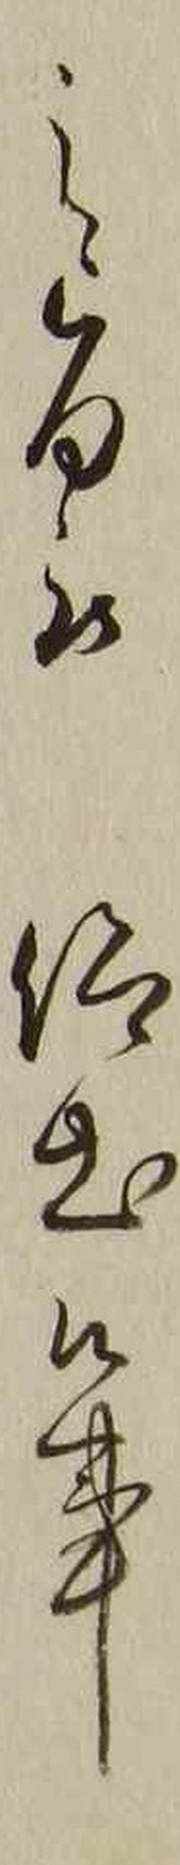之旨被仰出候事
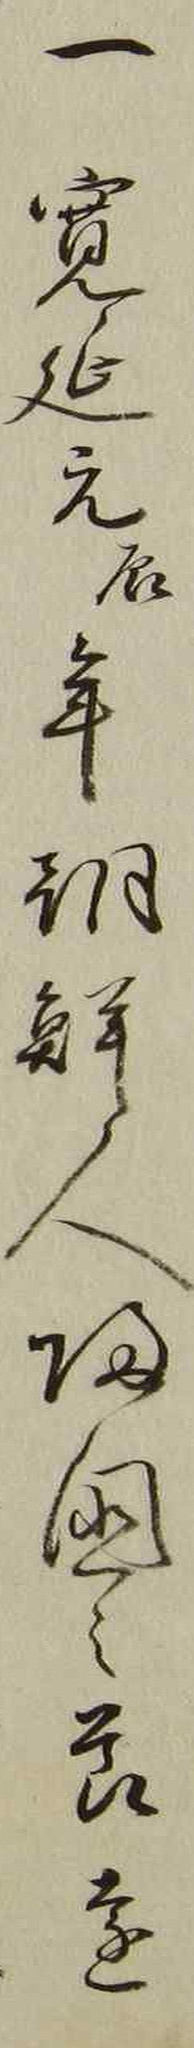一寛延元辰年朝鮮人帰国之節遠
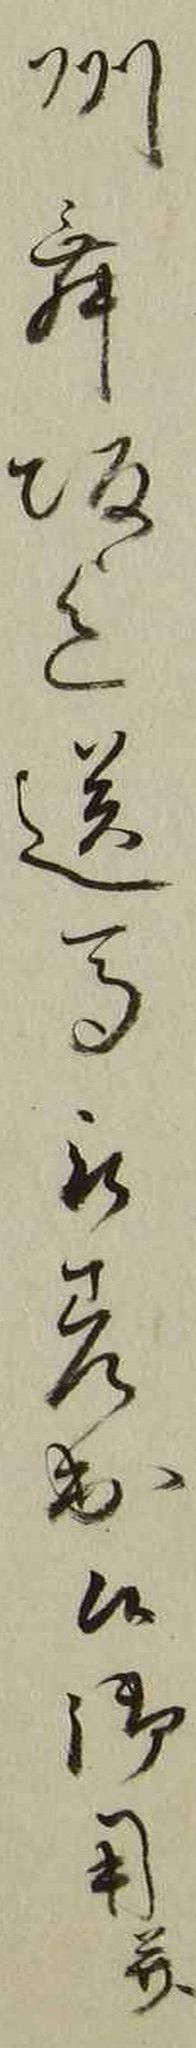州舞坂迄送馬被差出候御用并
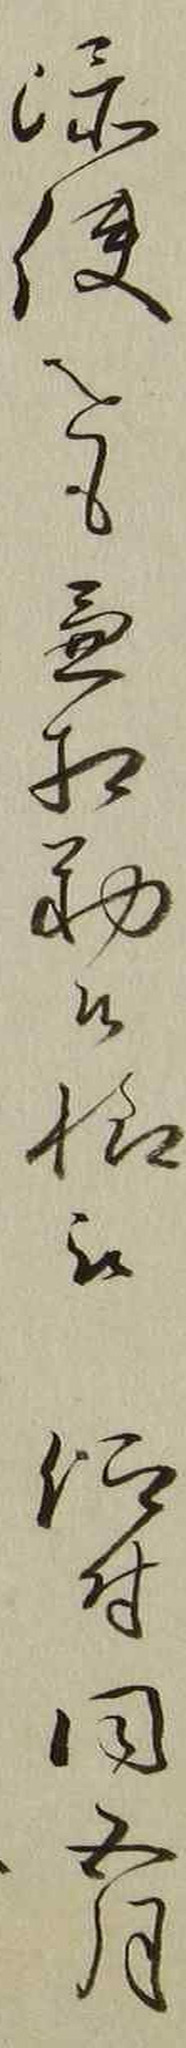添使をも兼相勤候様被仰付同五月
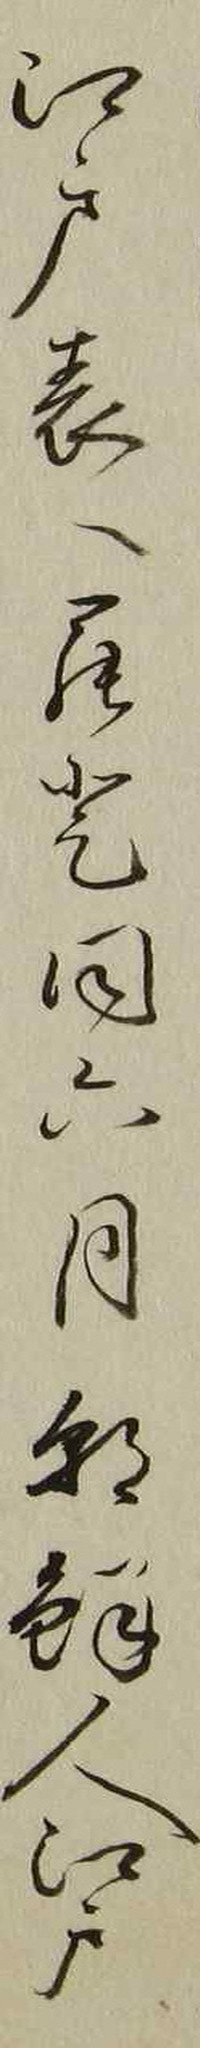江戸表へ罷登同六月朝鮮人江戸
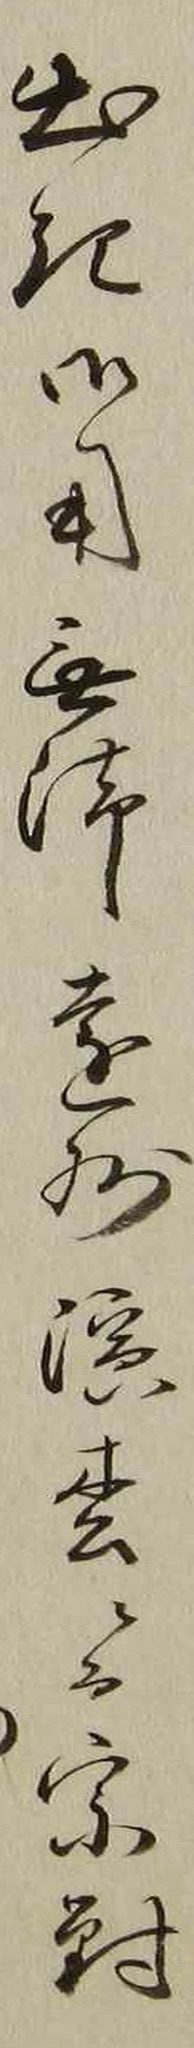出起御用無滞遠州浜松ニ而宗対
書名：諸士系譜　巻之3　い之部3
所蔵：会津若松市立会津図書館
